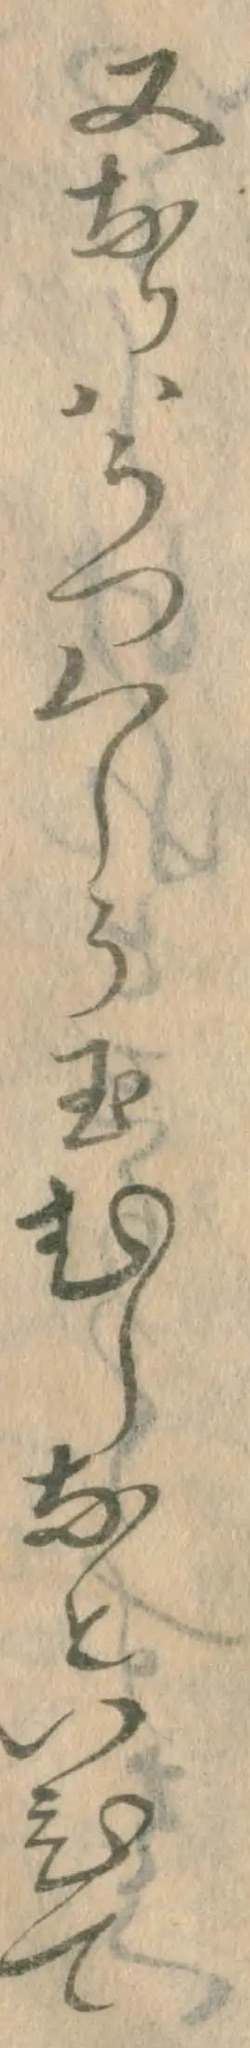又なりはうつくしう玉むしなといひて

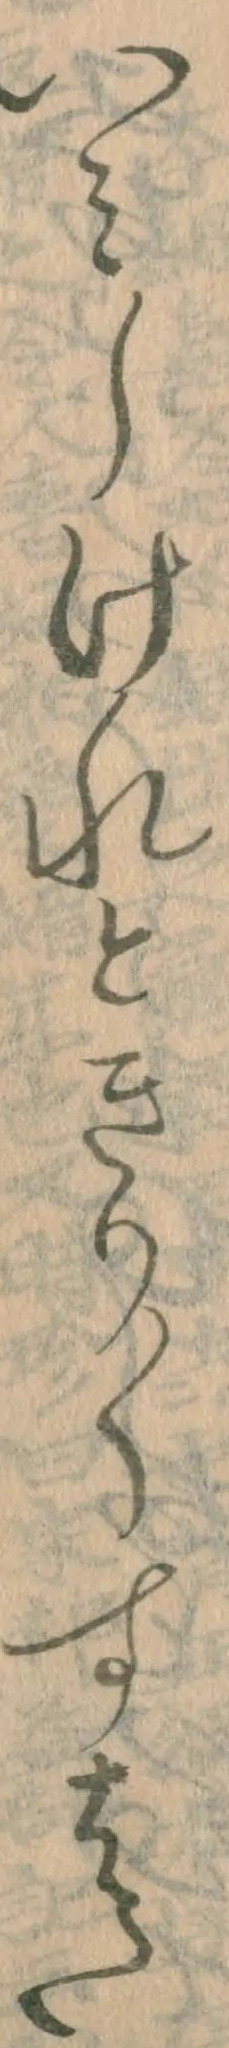いみしけれときり〳〵すはた
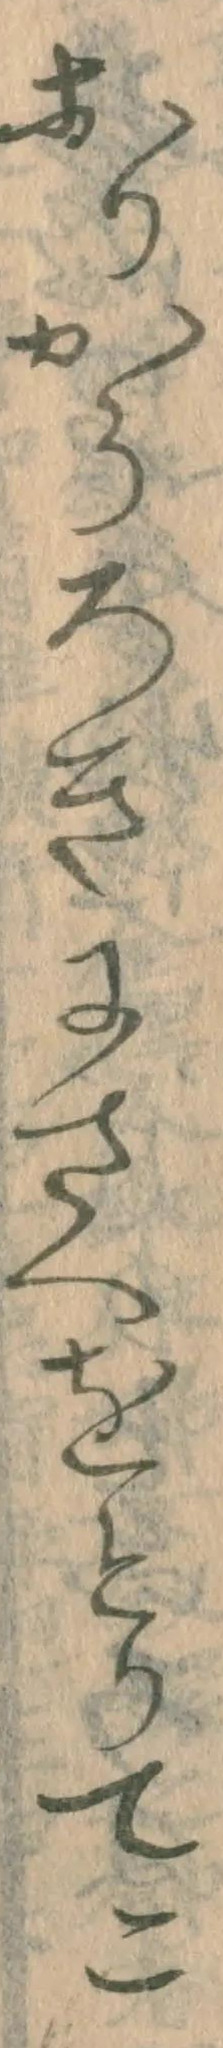おりかうろきにさへをとりてこ
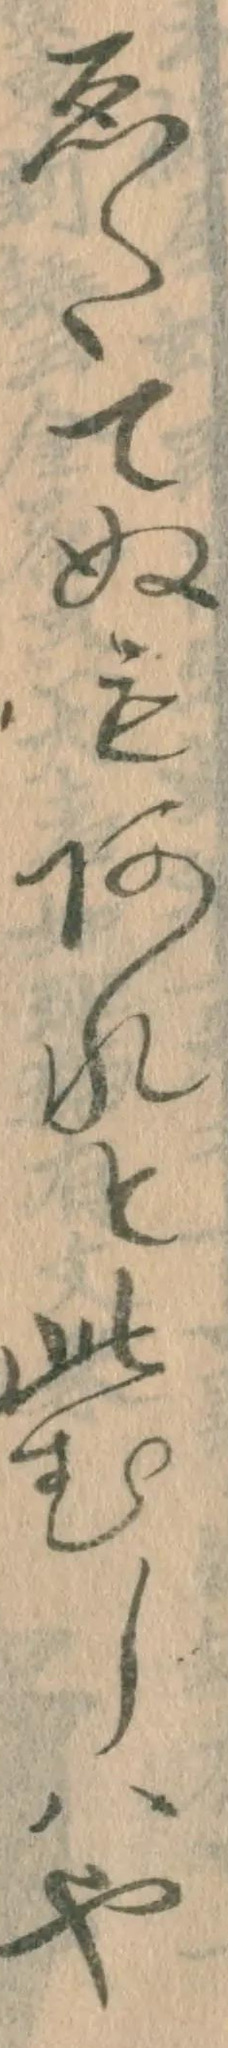ゑたてぬもあれと此むしはや
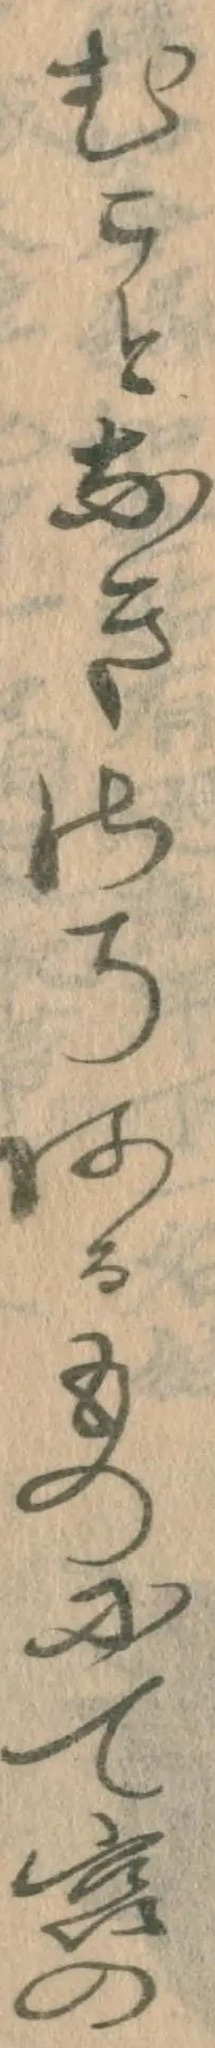むことなきさちあるものにて宮の
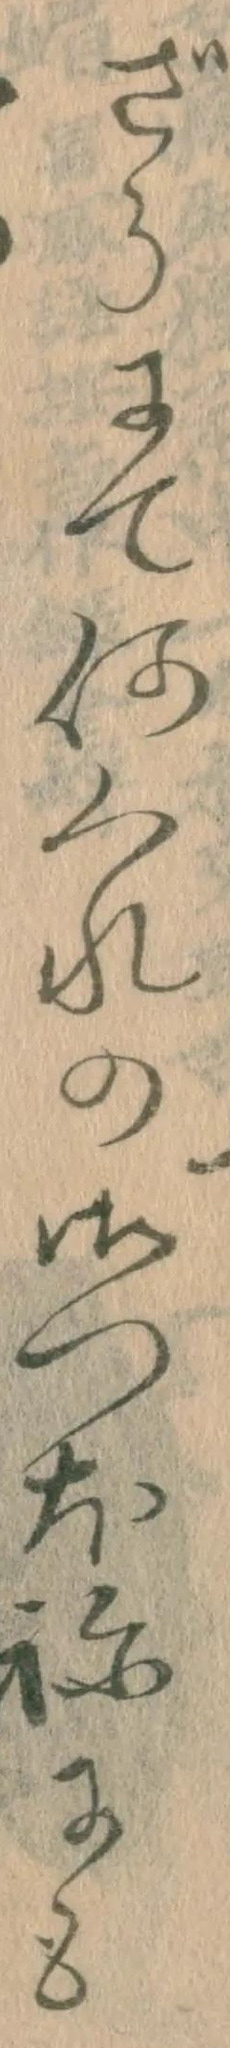ざうにて何くれの御つほねにも
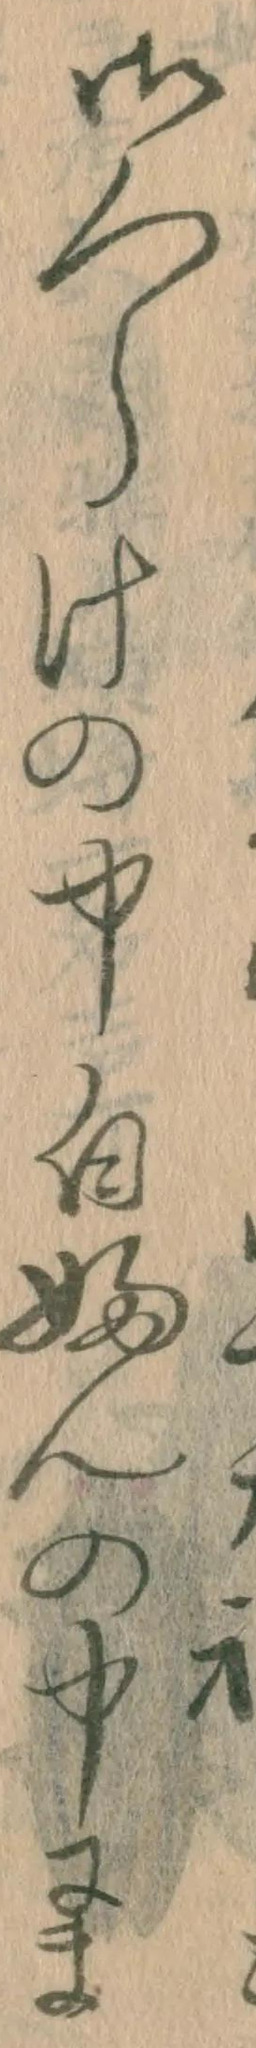御くしけの中白ふんの中にま
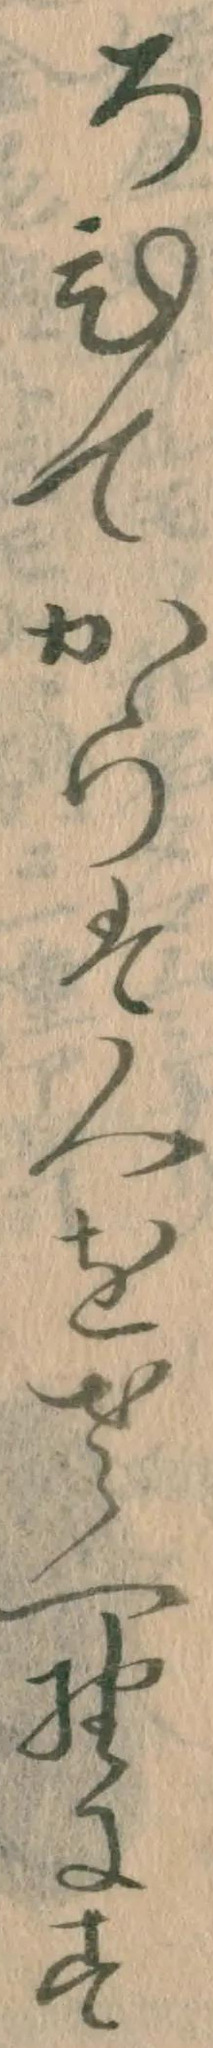ろひてかくは人をさへ野にす
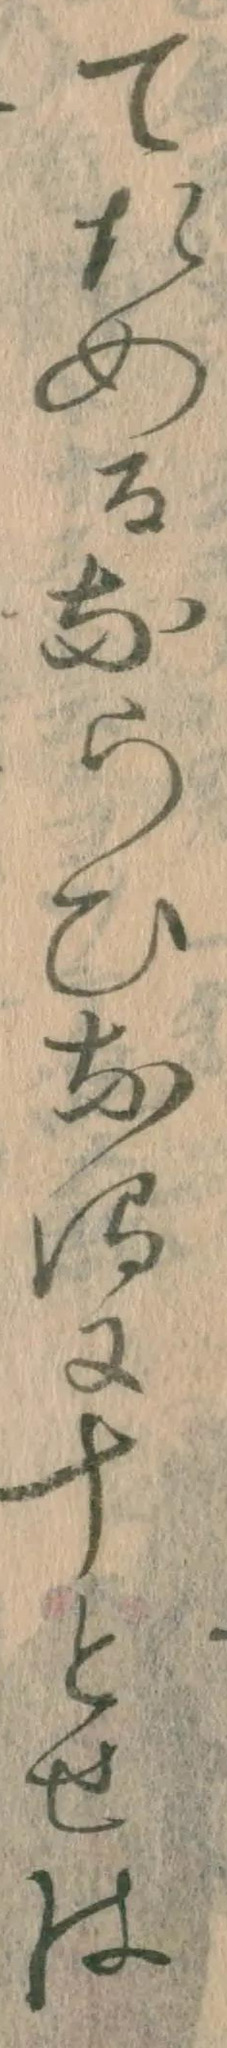てためるならひなるに十とせは
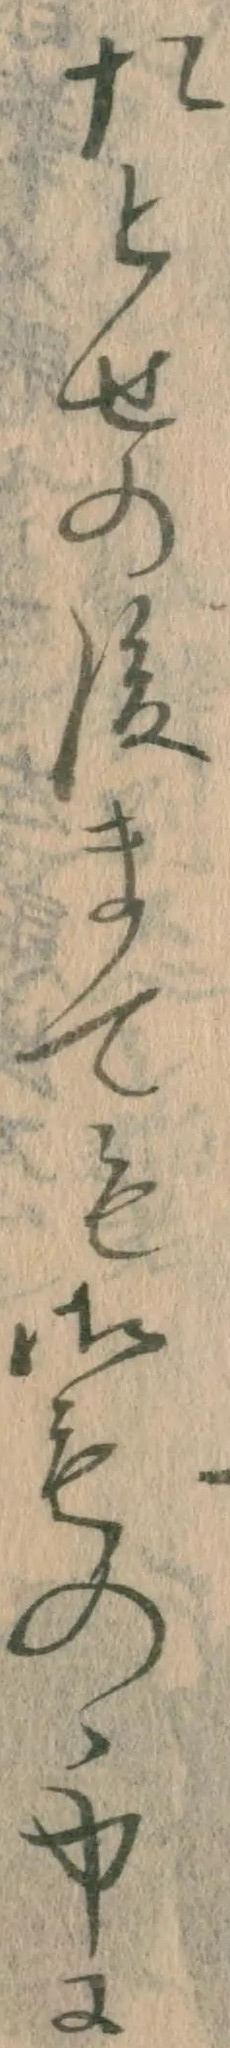たとせの後まても御ものゝ中に
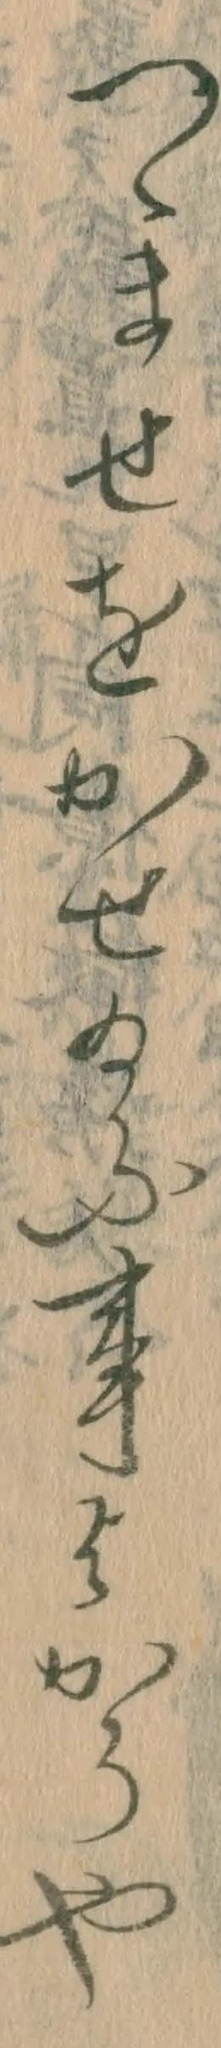つゝませをかせ給ふ事よかうや
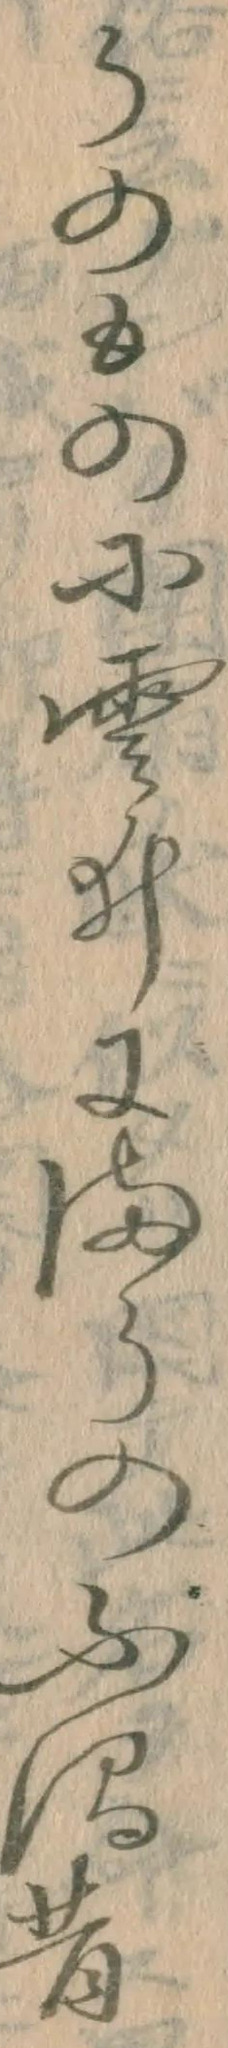うのものに雲井にまうのふる昔
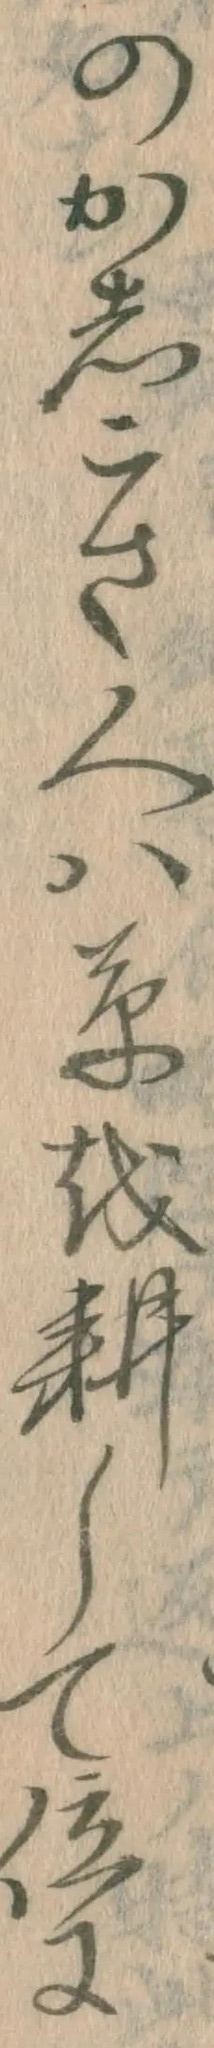のかしこさ人は草を耕して位に
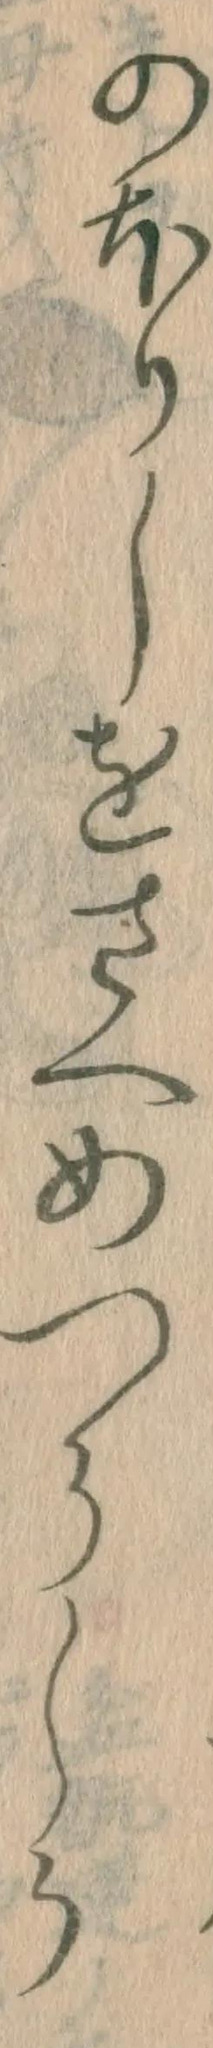のほりしをさへめつらしう
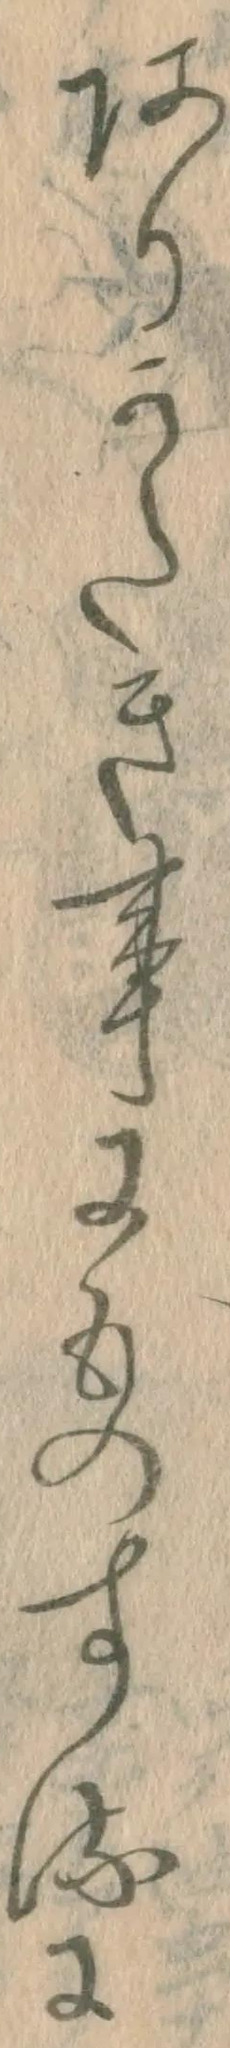ありかたき事にものするに
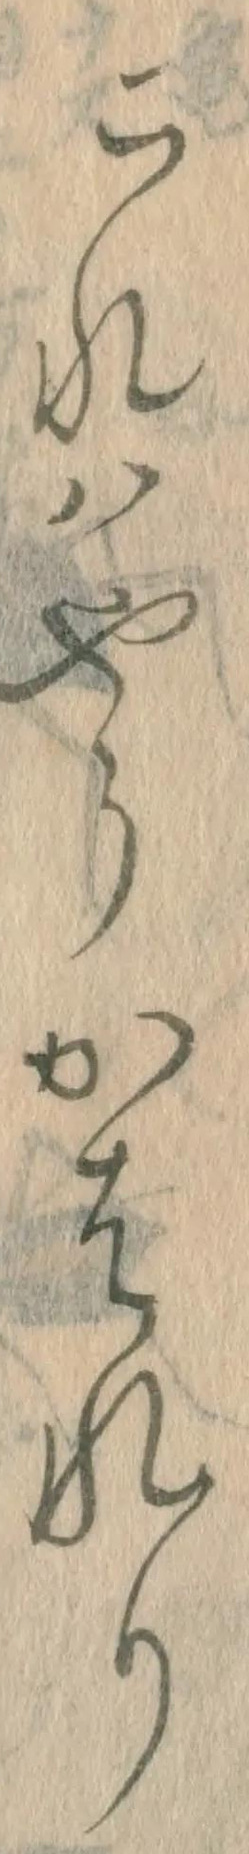これはやうかはれり
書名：千蟲譜 3巻. [1]
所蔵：国立国会図書館 National Diet Library, JAPAN
